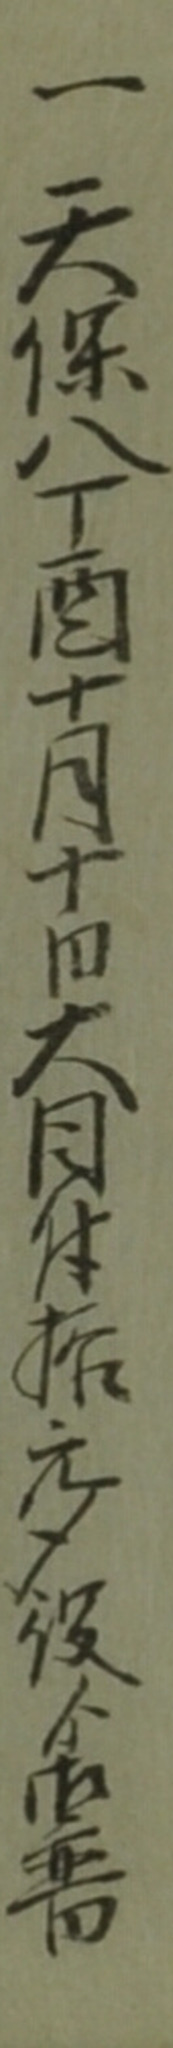一天保八丁酉十月十日大目付格元〆役ゟ御普
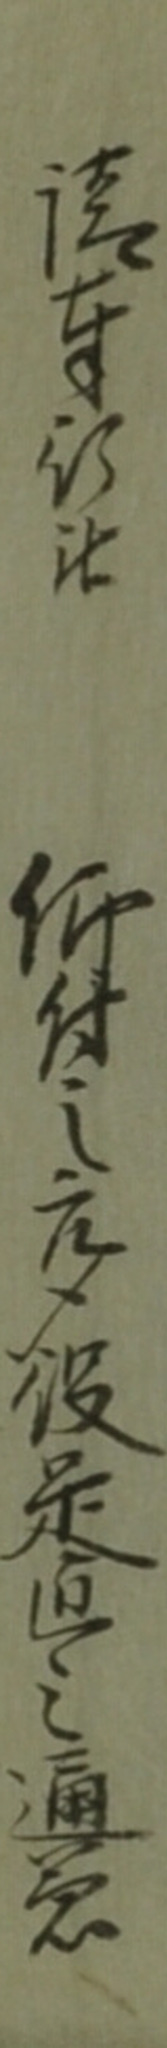請奉行被仰付之元〆役是迄之通兼
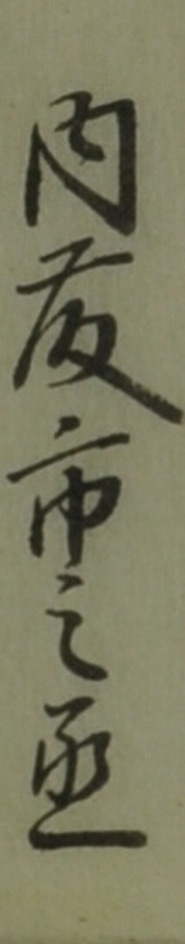内藤市之丞
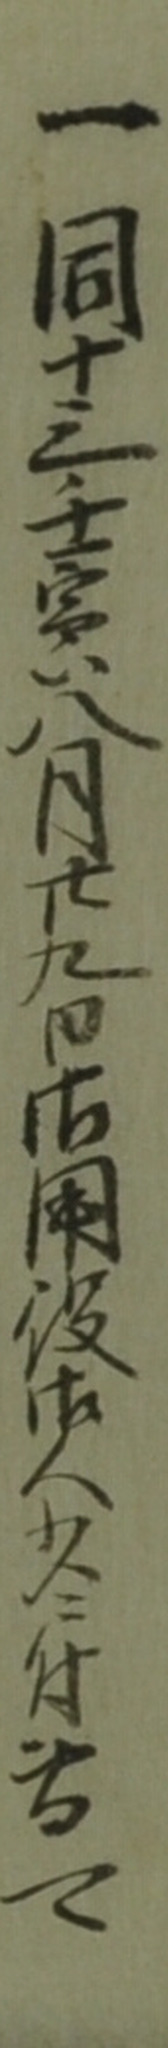一同十三壬寅八月廿九日御用役御人少ニ付専可
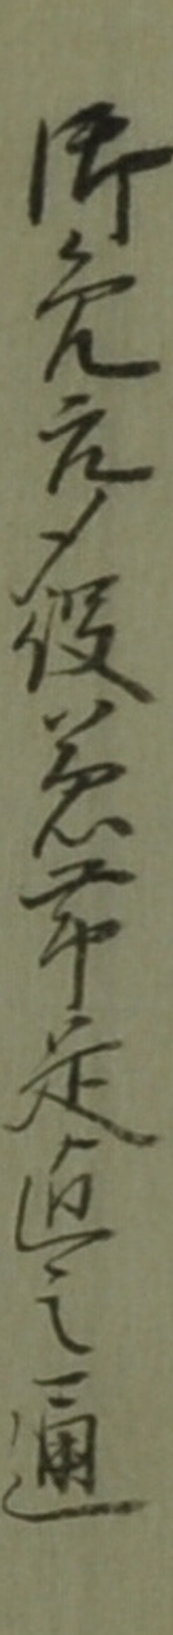御免元〆役兼帯是迄之通
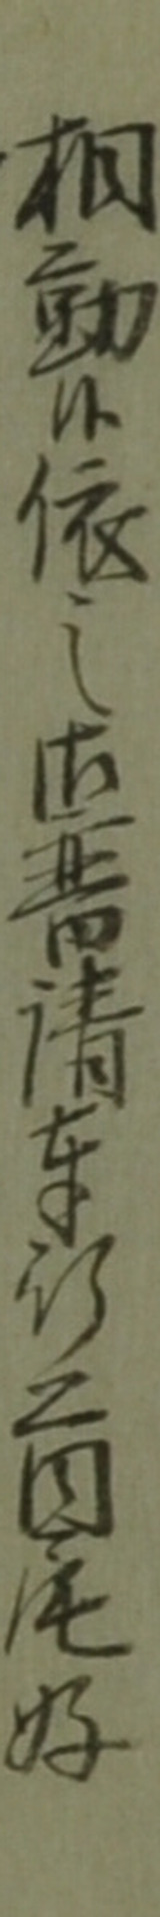相勤候依之御普請奉行首尾好
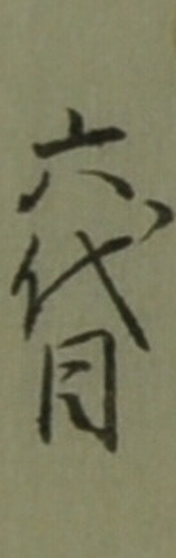六代目
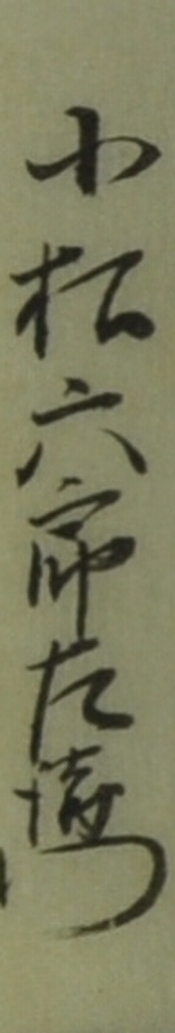小松六郎左衛門

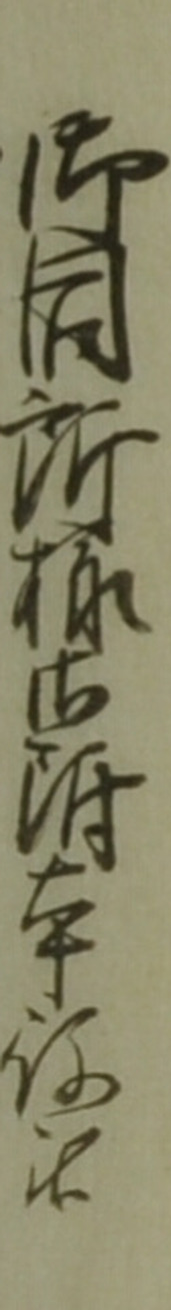御同所様御附本役被
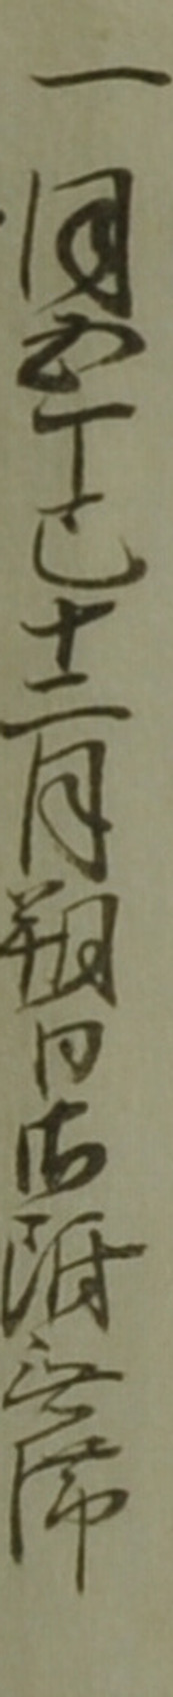一同五丁巳十二月朔日御附無滞
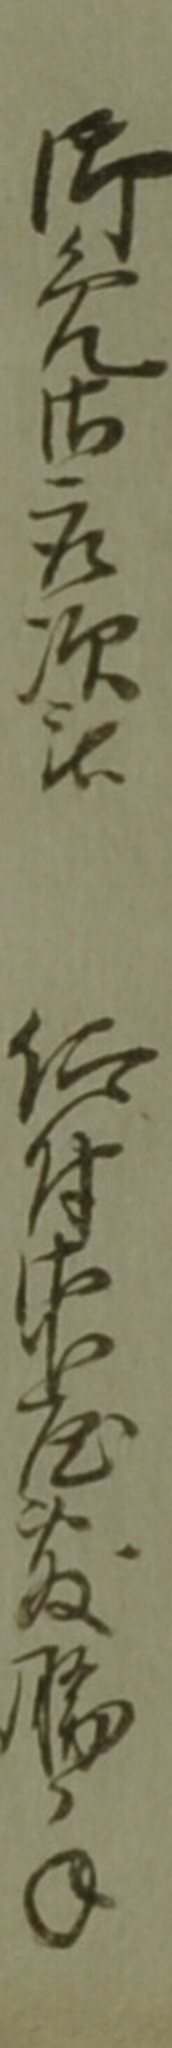御免御取次被仰付御下屋敷勝手
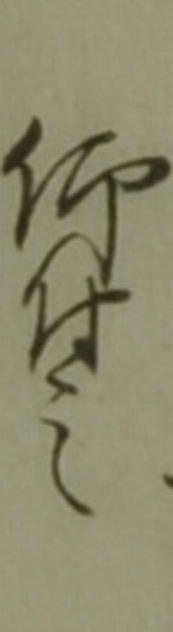仰付之
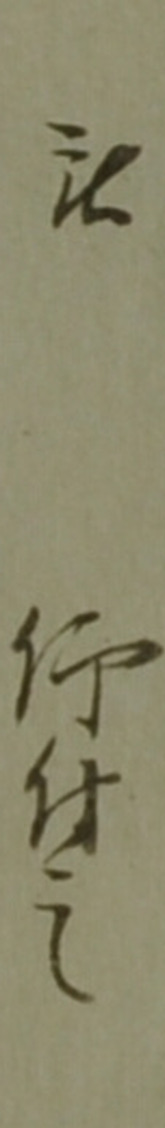被仰付之
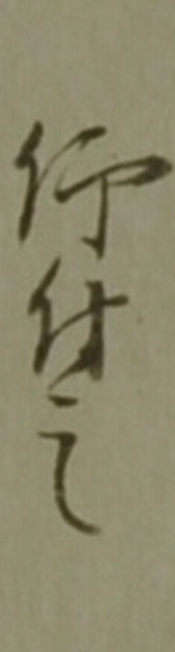仰付之
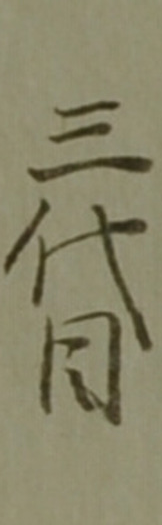三代目
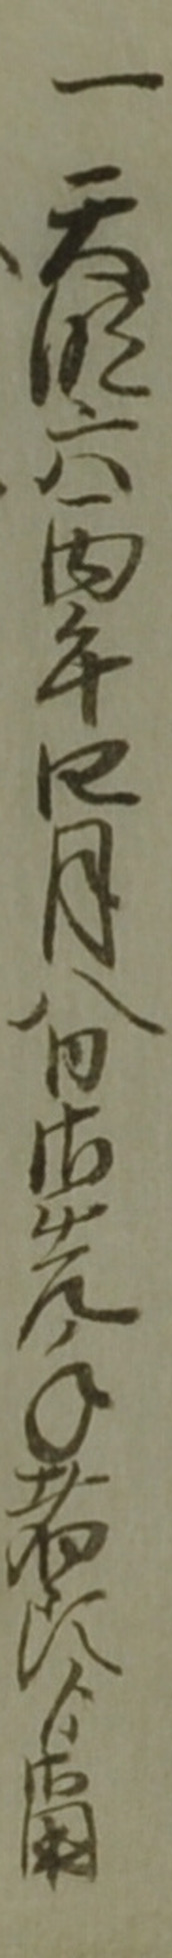一天明六丙午四月八日御先手者頭ゟ御用
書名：諸御役代々録（六）
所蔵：伊那市立高遠町図書館・合同会社AMANE
